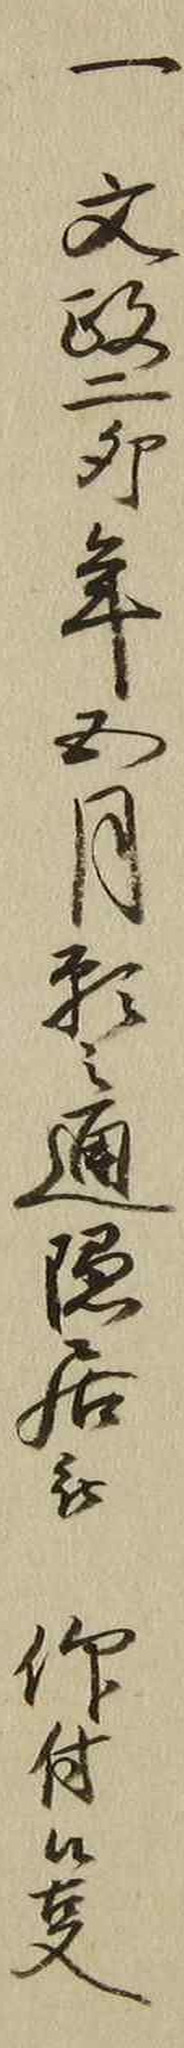一文政二卯年五月願之通隠居被仰付候事
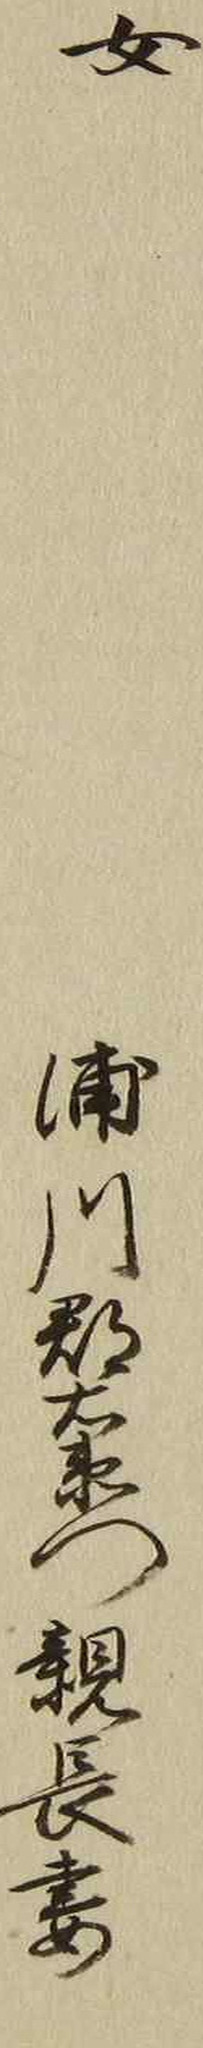女浦川郡右衛門親長妻
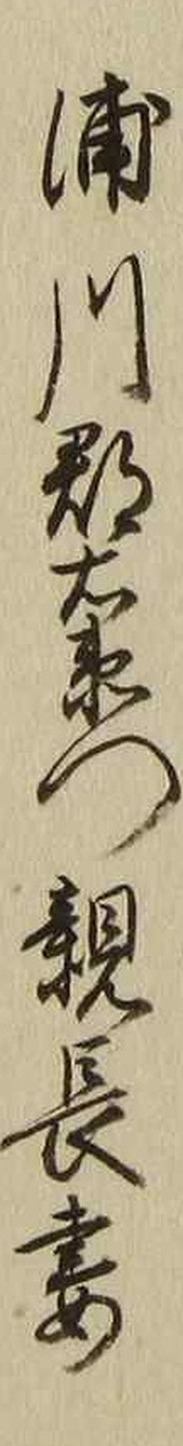女浦川郡右衛門親長妻
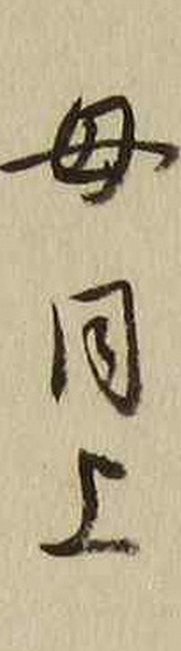母同上
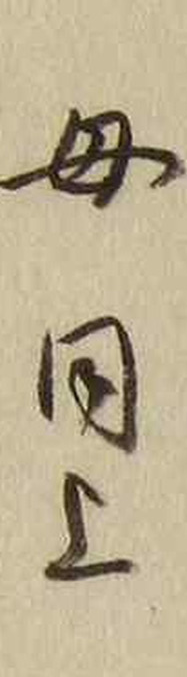母同上

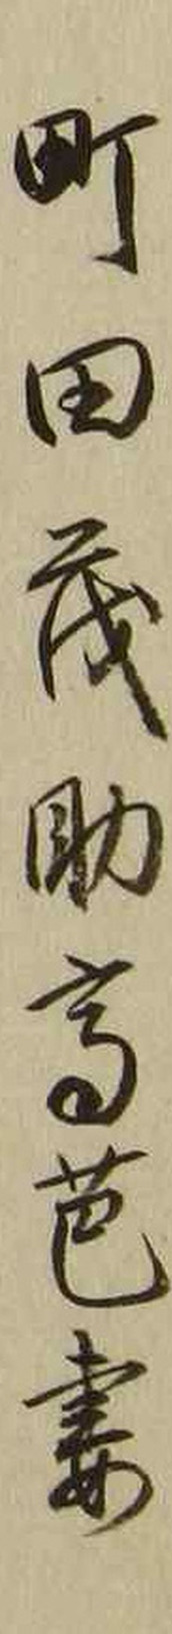女町田茂助高芭妻
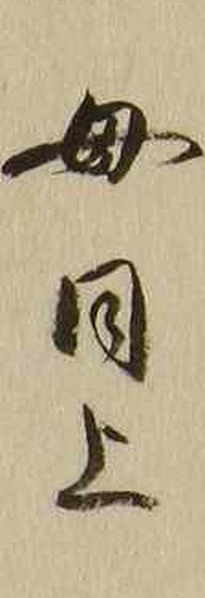母同上
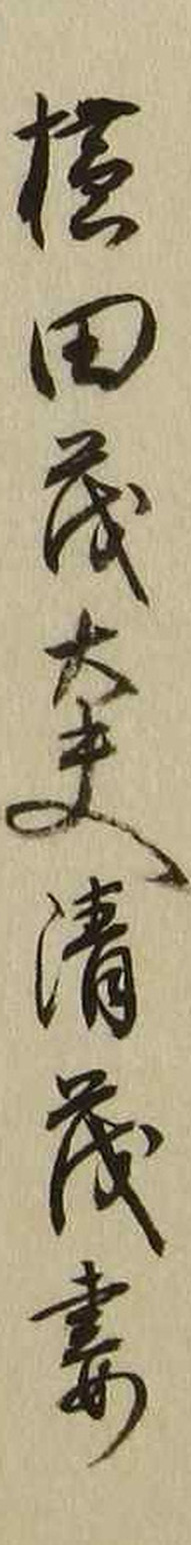横田茂大夫清茂妻
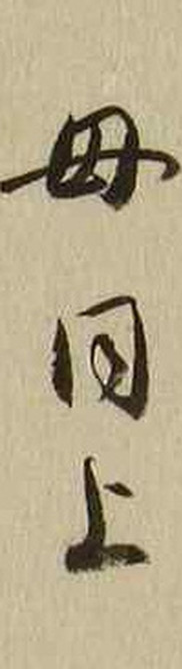母同上
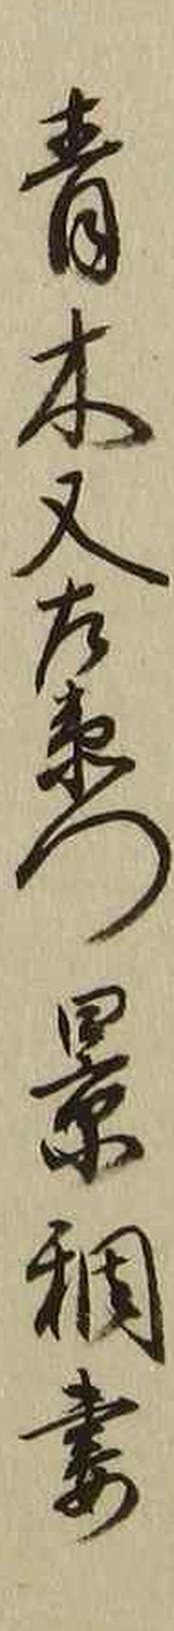女青木又左衛門景稠妻
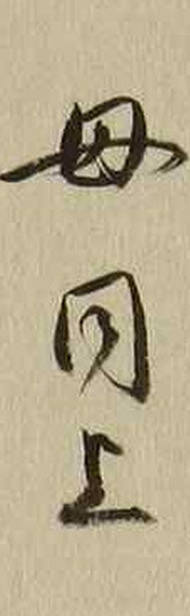母同上
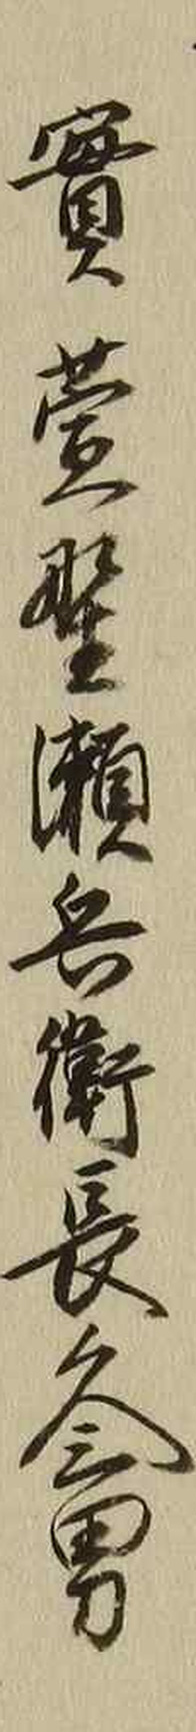実萱野瀬兵衛長久三男
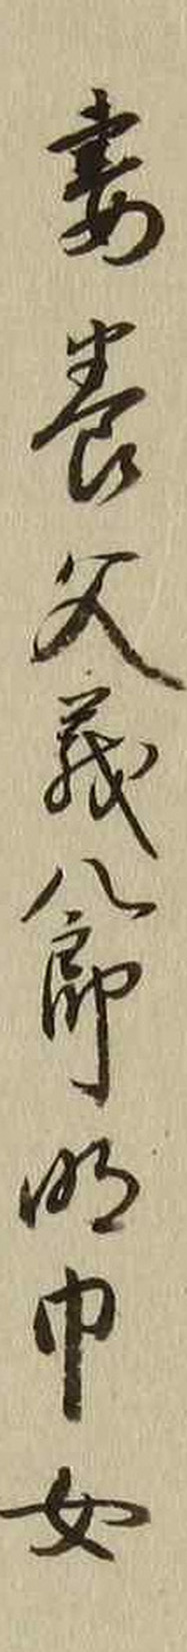妻養父義八郎明巾女
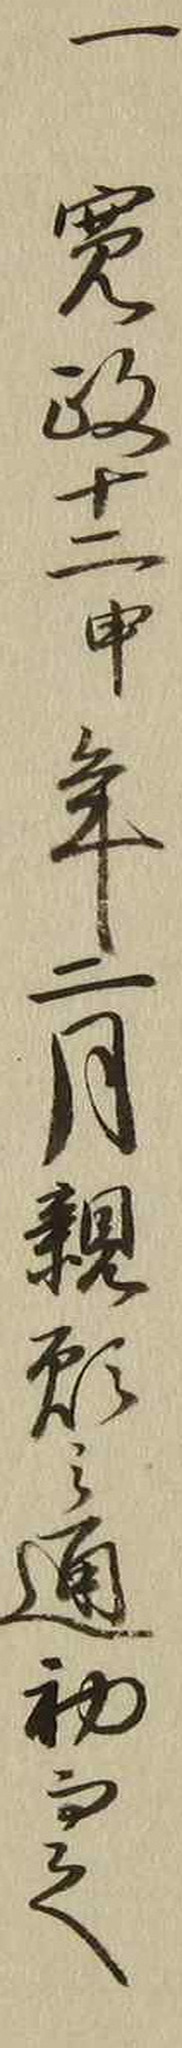一寛政十二申年二月親願之通初而之
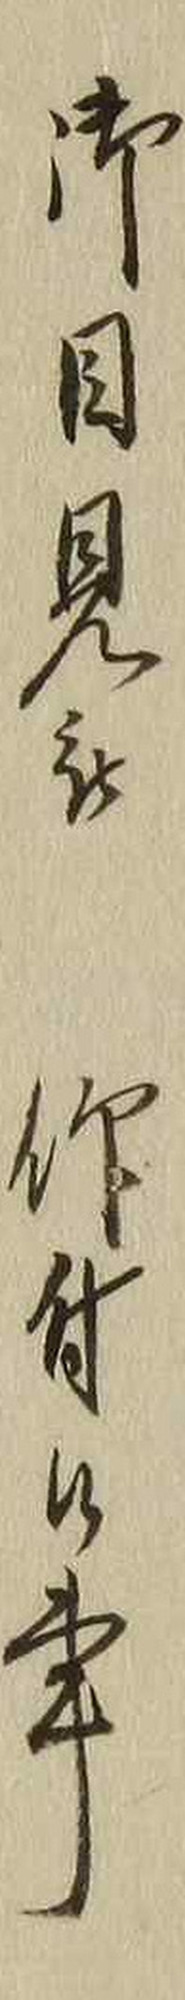御目見被仰付候事
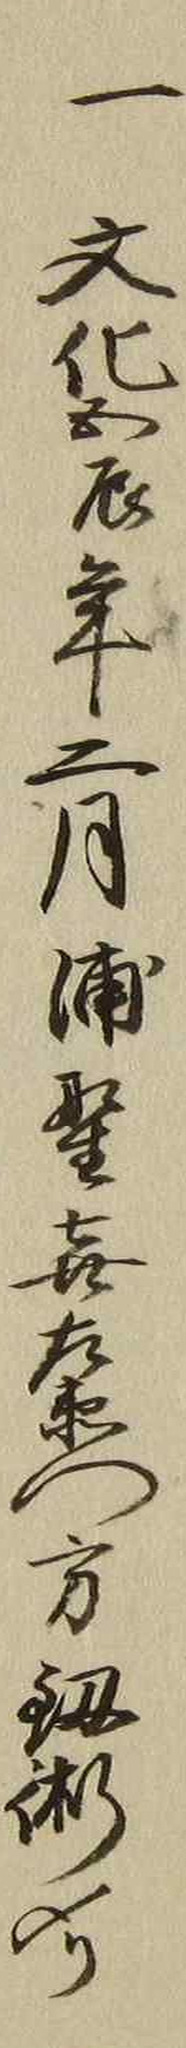一文化五辰年二月浦野喜左衛門方剣術〆り
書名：諸士系譜　巻之128　た之部4
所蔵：会津若松市立会津図書館
